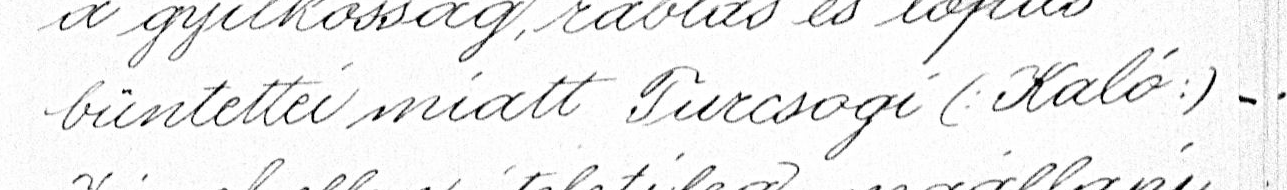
büntettei miatt Turcsogi (:Kaló:) -
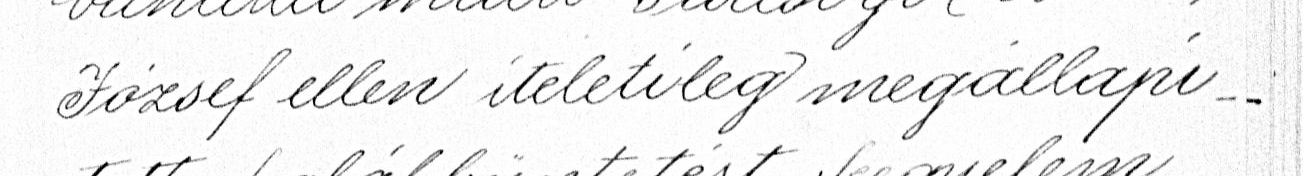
József ellen iteletileg megállapi¬
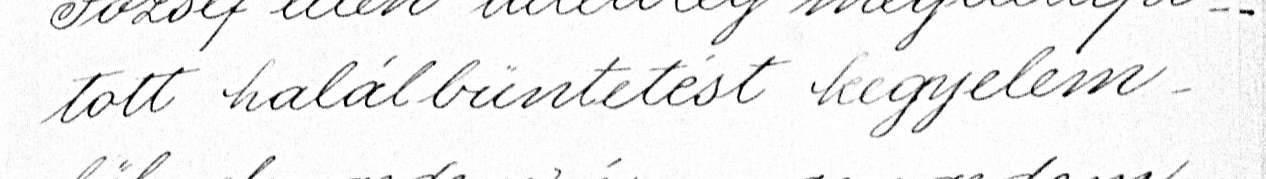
tott halálbüntetést kegyelem¬
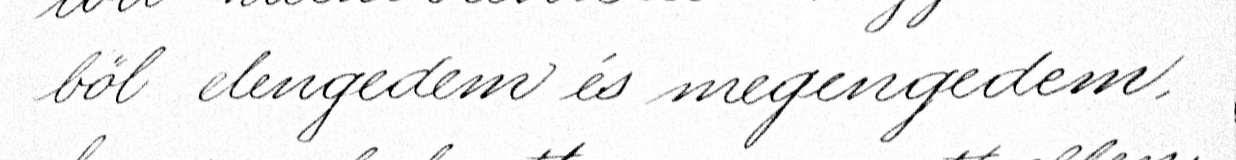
böl dengedem és megengedem,
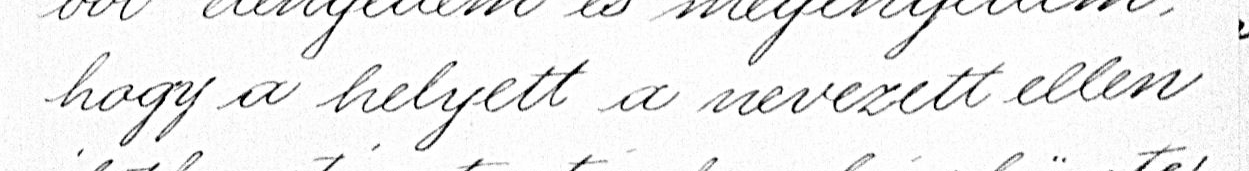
hogy a helyett a nevezett ellen
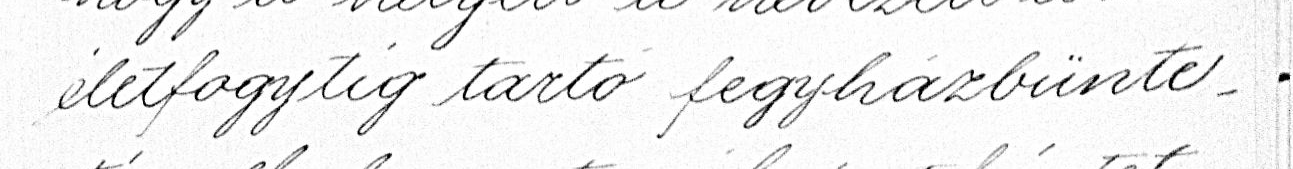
életfogytig tarto fegyházbünte¬
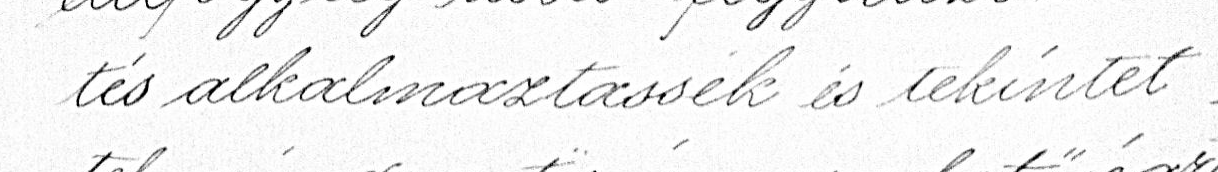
tés alkalmaztassék és tekintet¬
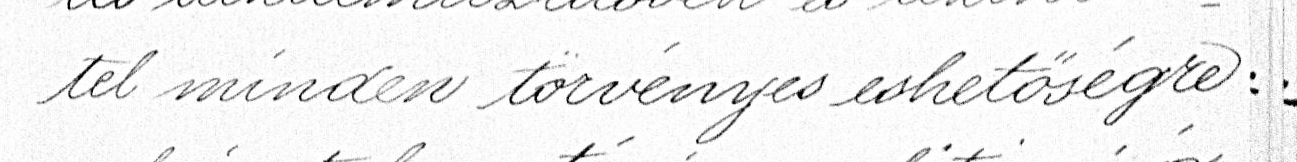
tel minden törvényes eshetöségre:
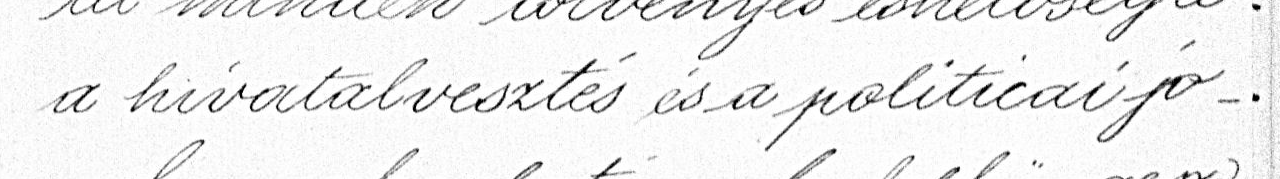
a hivatalvesztés és a politicai jo¬
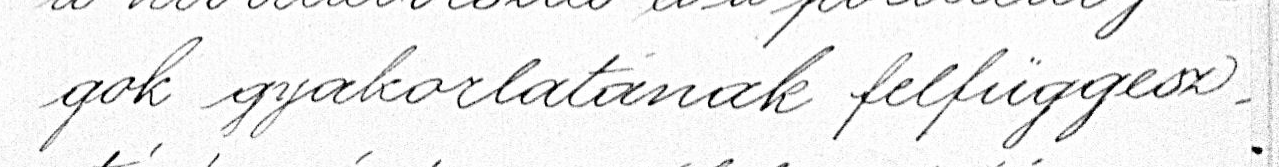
gok gyakorlatának felfüggesz¬
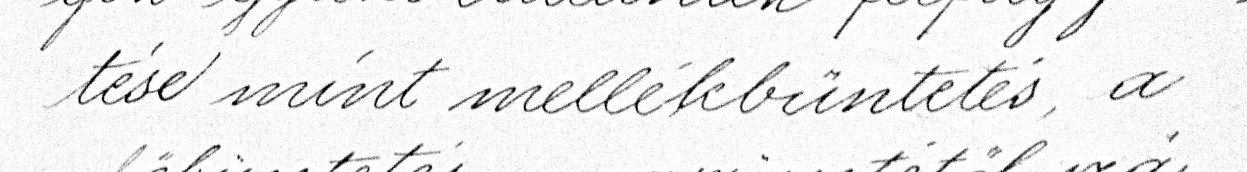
tése mint mellékbüntetés,
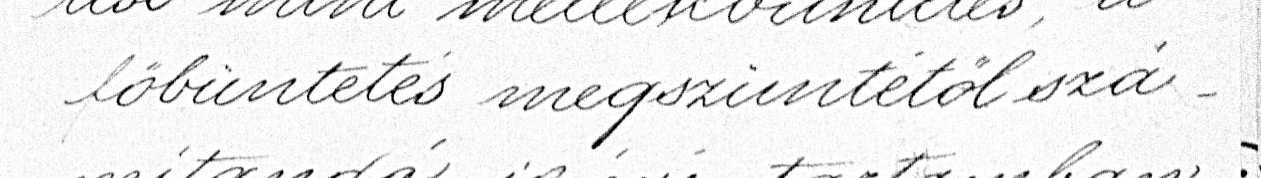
a föbüntetés meqszimtétöl szá¬
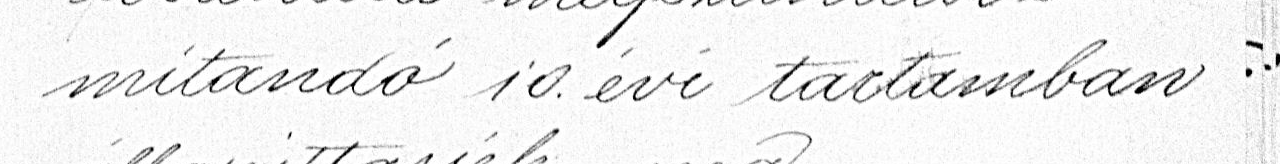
mitandó 10. évi tartamban
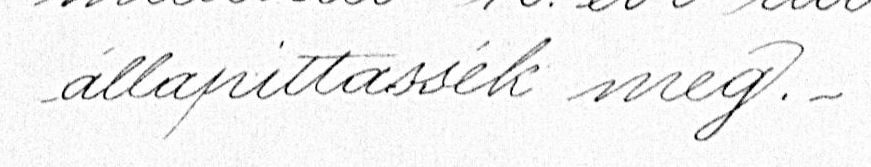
állapittassék meg. -
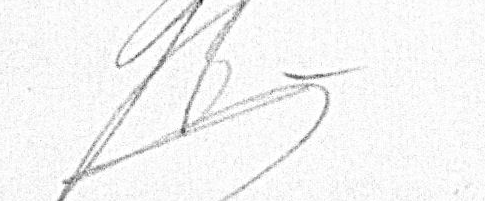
xx
